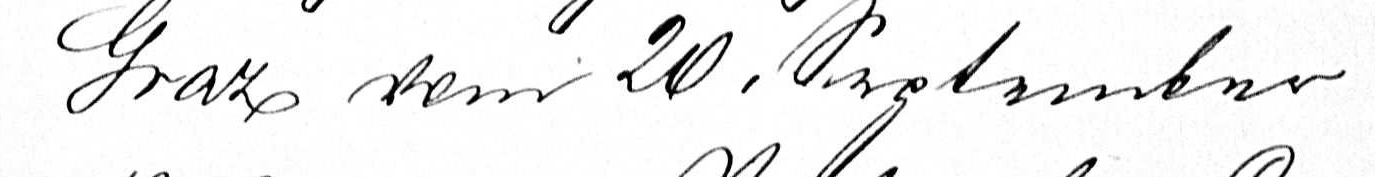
Graz vom 20. September
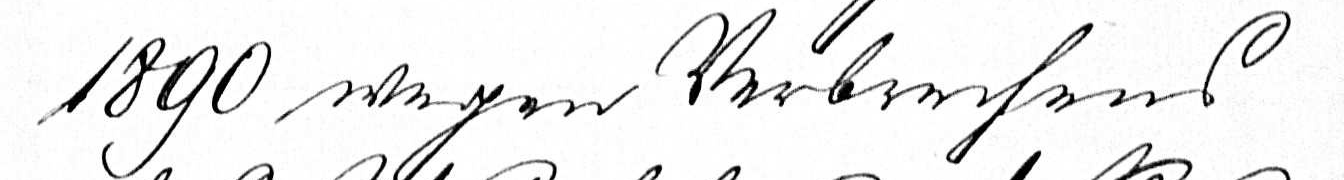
1890 wegen Verbrechens
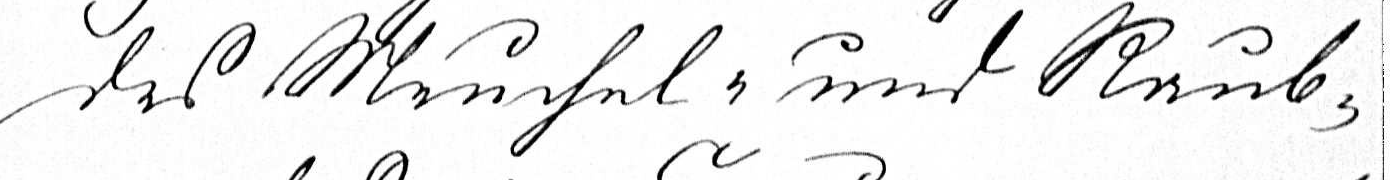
des Meuchel- und Raub¬
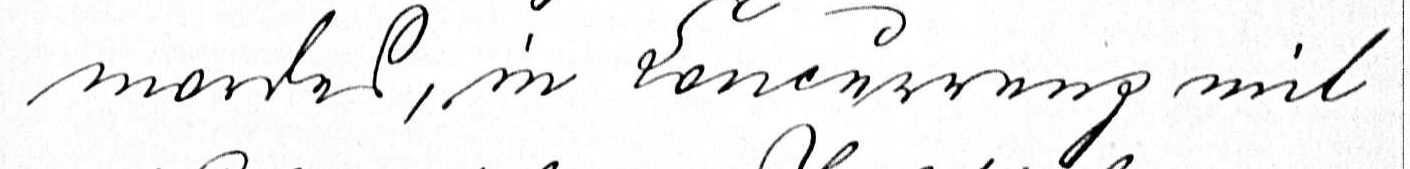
mordes, in Concurrenz mit
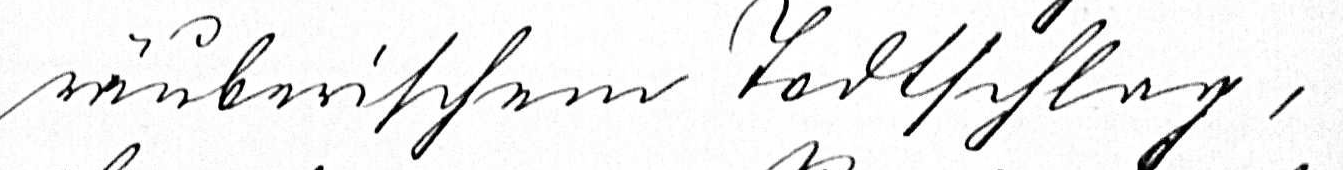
räuberischem Todtschlag,
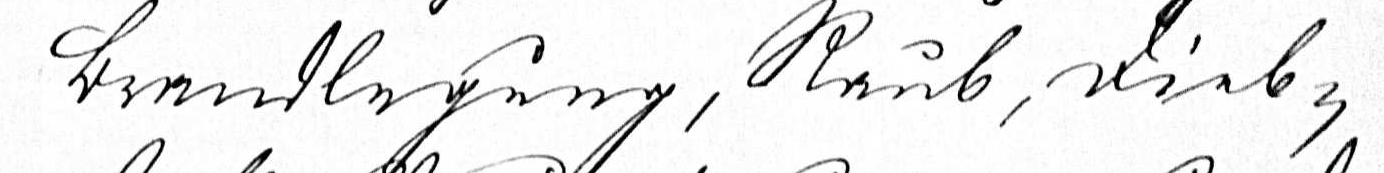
Brandlegung, Raub, Dieb¬
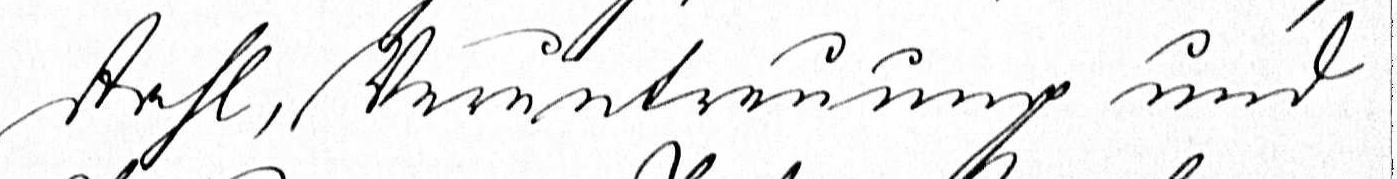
stahl, Veruntreuung und
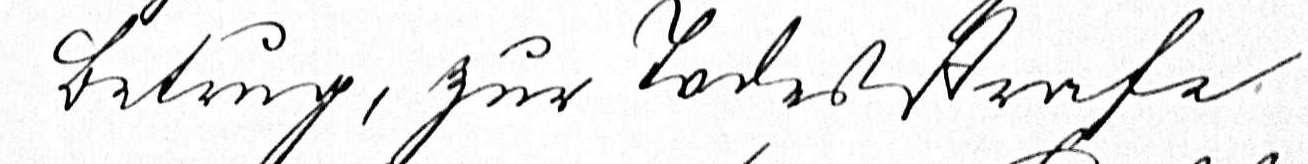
Betrug, zur Todesstrafe
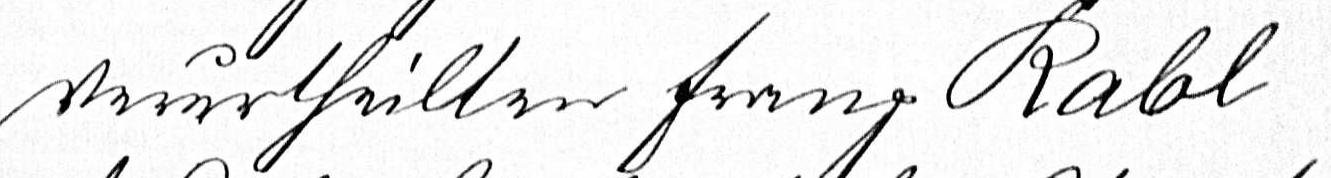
verurtheilten Franz Rabl
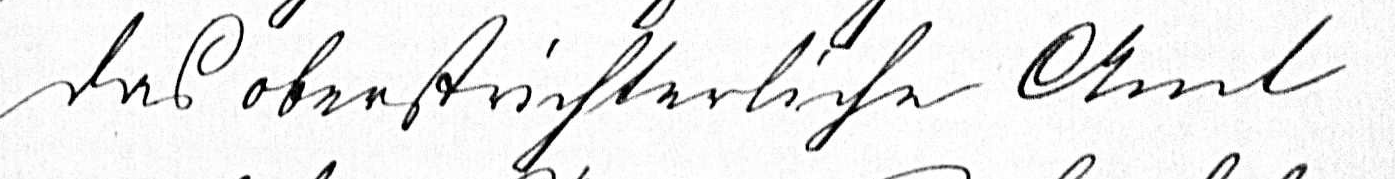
das oberstrichterliche Amt
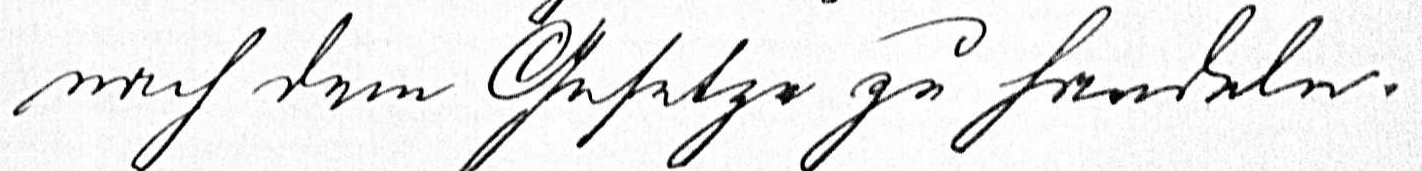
nach dem Gesetze zu handeln.
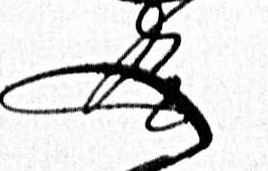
xx
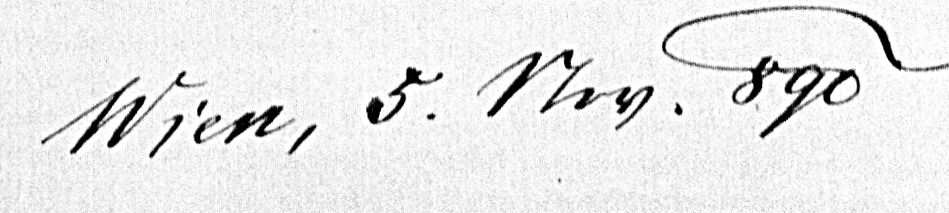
Wien, 5. Nov. 890
